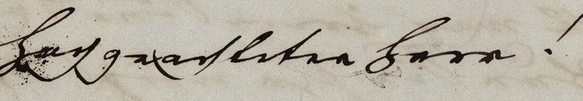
Hochgeachteter Herr!
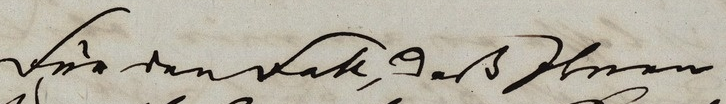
Für den Fall, daß Ihnen
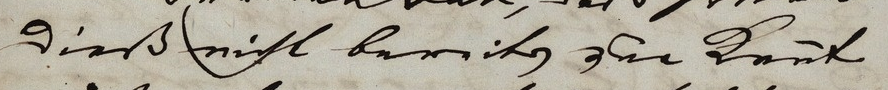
dieß nicht bereits zur Kennt-
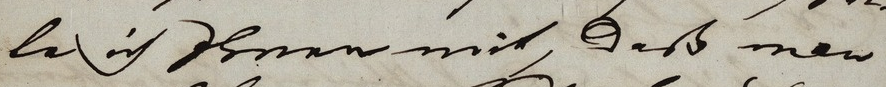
le ich Ihnen mit, daß man
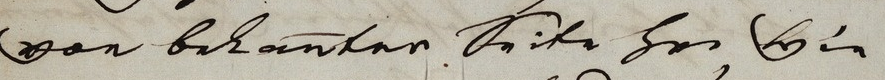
von bekannter Seite her, wie
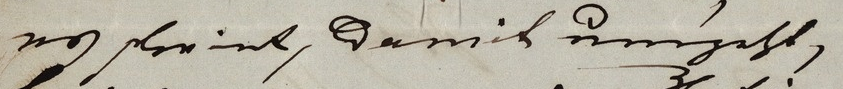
es scheint, damit umgeht,
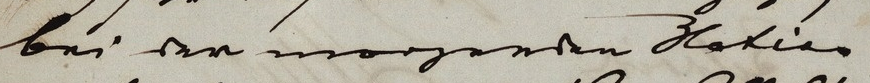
bei der morgenden Natio-
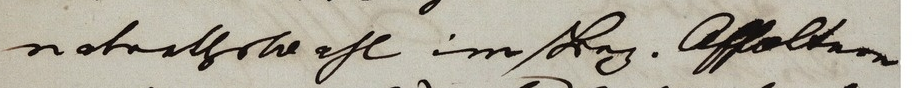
nalrathswahl im Bez. Affoltern
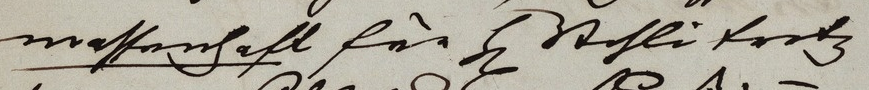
massenhaft für Herrn Stehli trotz
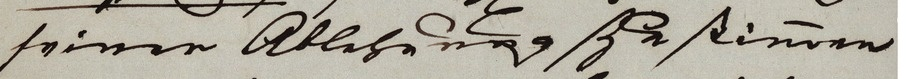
seiner Ablehnung zu stimmen
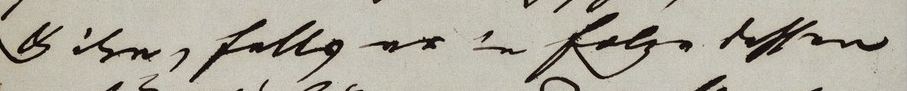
& ihn, falls er in Folge dessen
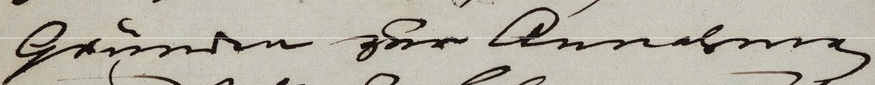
Gründen zur Annahme
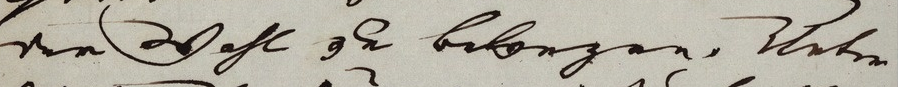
der Wahl zu bewegen. Unter
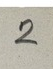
unse-
